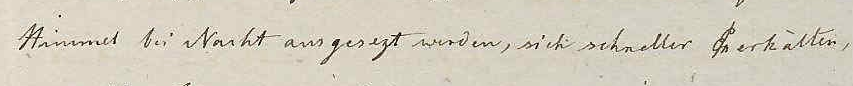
Himmel bei Nacht ausgesezt werden, sich schneller Ererkälten,
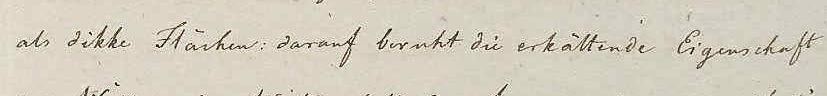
als dikke Flächen: darauf beruht die erkältende Eigenschaft
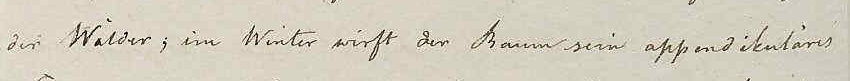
der Wälder; im Winter wirft der Baum sein appendikuläres
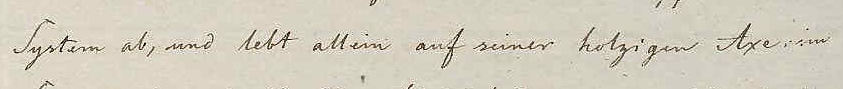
System ab, und lebt allein auf seiner holzigen Axe: im
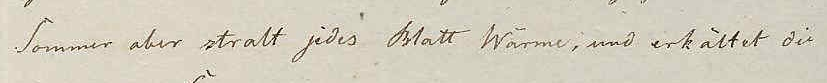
Sommer aber stralt jedes Blatt Wärme, und erkältet die
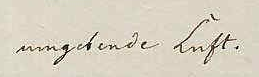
umgebende Luft.
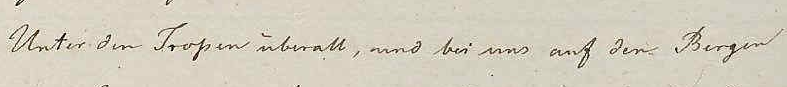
Unter den Tropen überall, und bei uns auf den Bergen
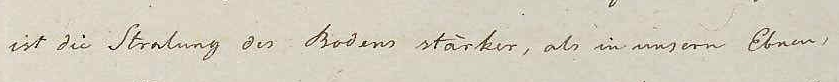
ist die Stralung des Bodens stärker, als in unsern Ebnen,
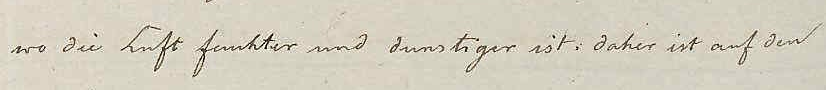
wo die Luft feuchter und dunstiger ist: daher ist auf den
